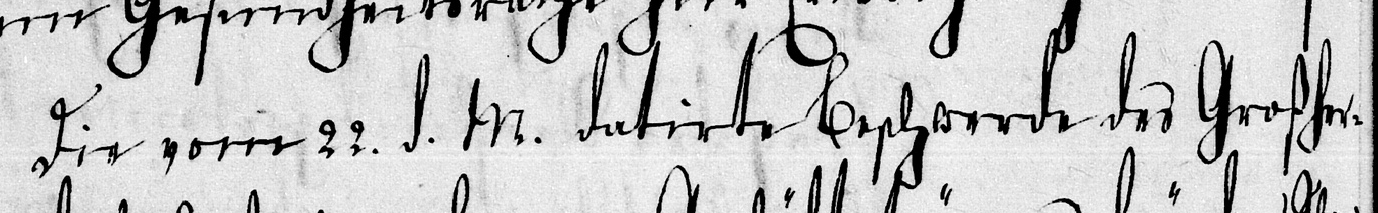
Die vom 22. d. M. datirte Beschwerde des Großher¬
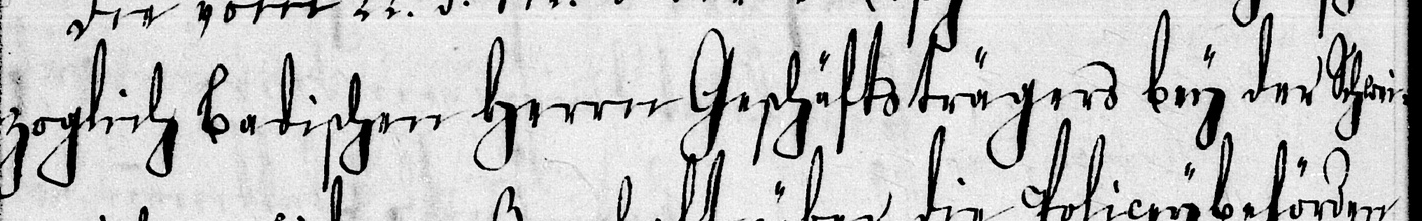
zoglich Badischen Herrn Geschäftsträgers bey der Sch¬
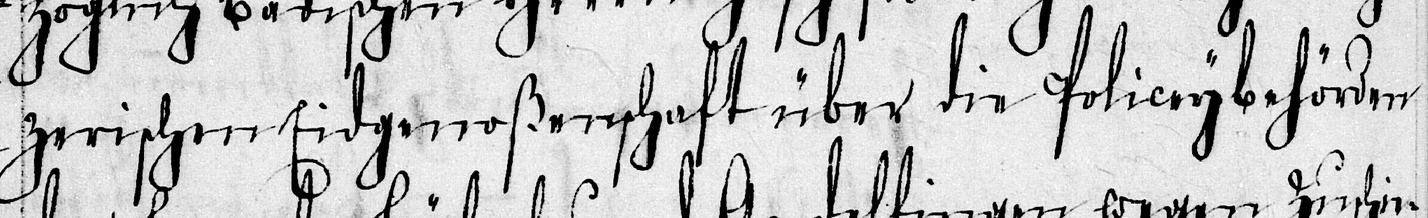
zerischen Eidgenoßenschaft über die Policeybehörden
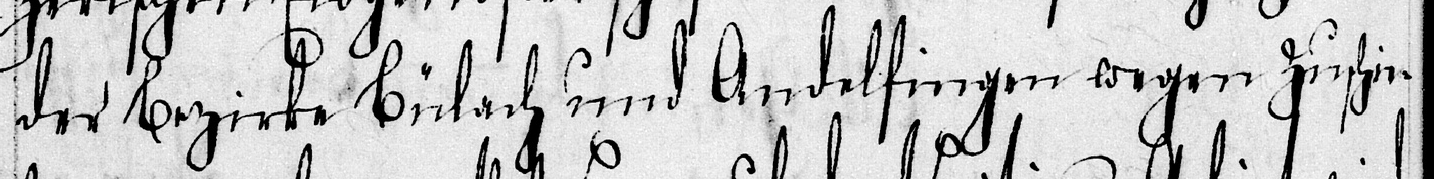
der Bezirke Bülach und Andelfingen wegen Zuschie¬
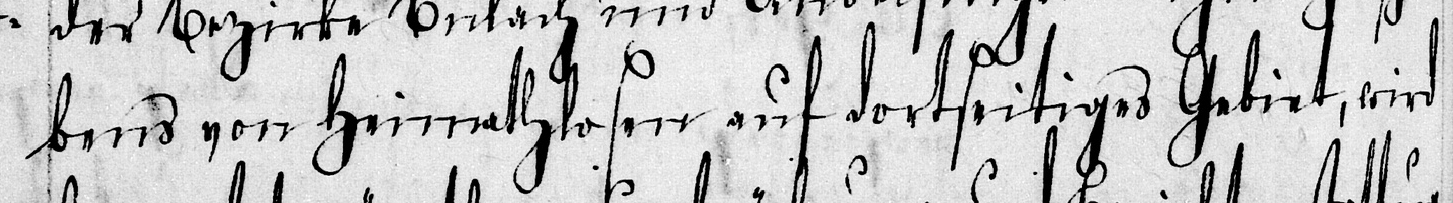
bens von Heimathlosen auf dortseitiges Gebiet, wi¬
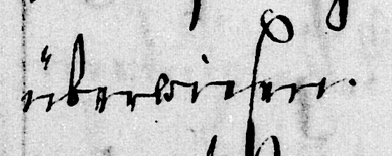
überwiesen.
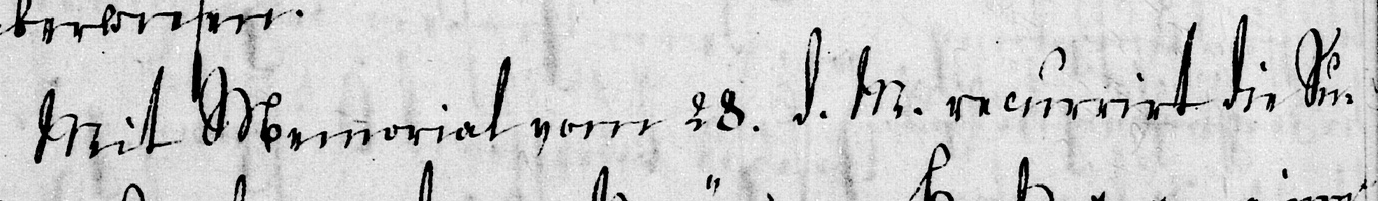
Mit Memorial vom 28. d. M. recurrirt die Su¬
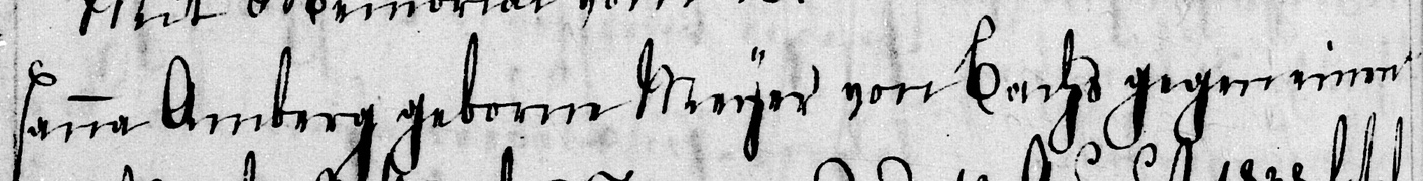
sanna Amberg geborne Meyer von Bachs gegen einen
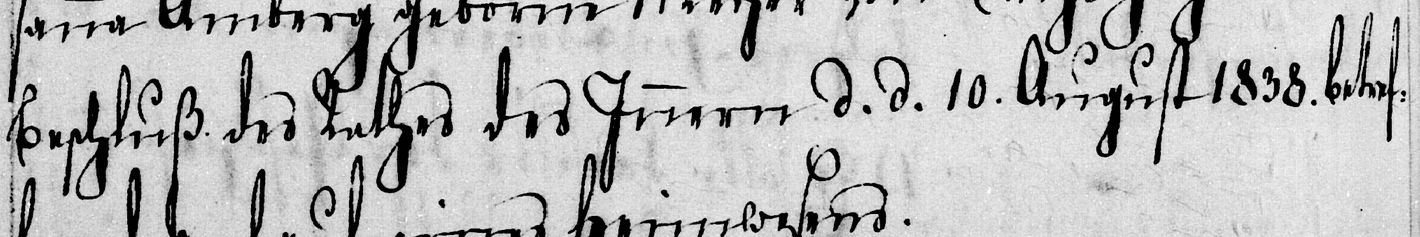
Beschluß des Rathes des Innern d. d. 10. August 1838. be¬
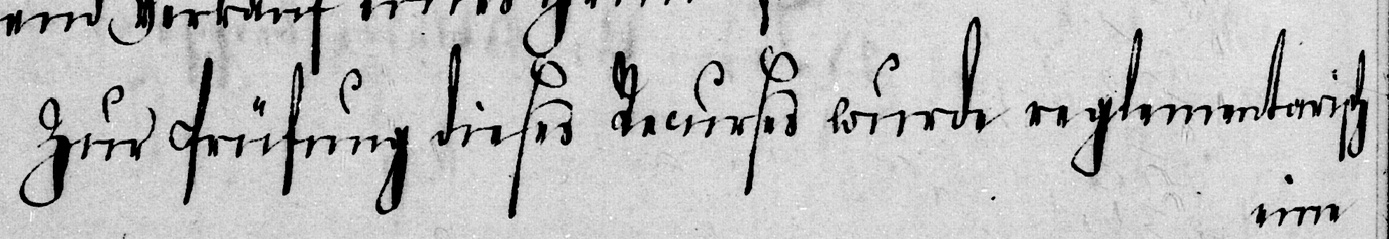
Zur Prüfung dieses Recurses wurde reglementari¬
